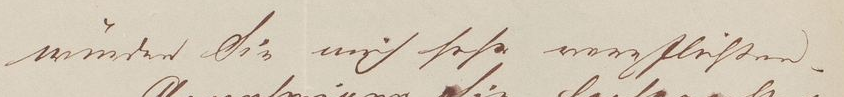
würden Sie mich sehr verpflichten.
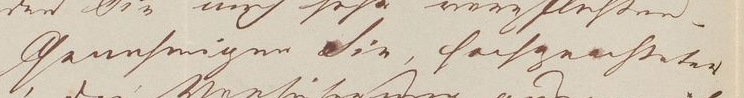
Genehmigen Sie, hochgeachteter
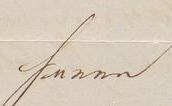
Herrn
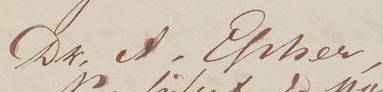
Dr. A. Escher,
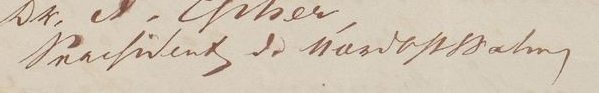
Praesident der NordostBahn,
